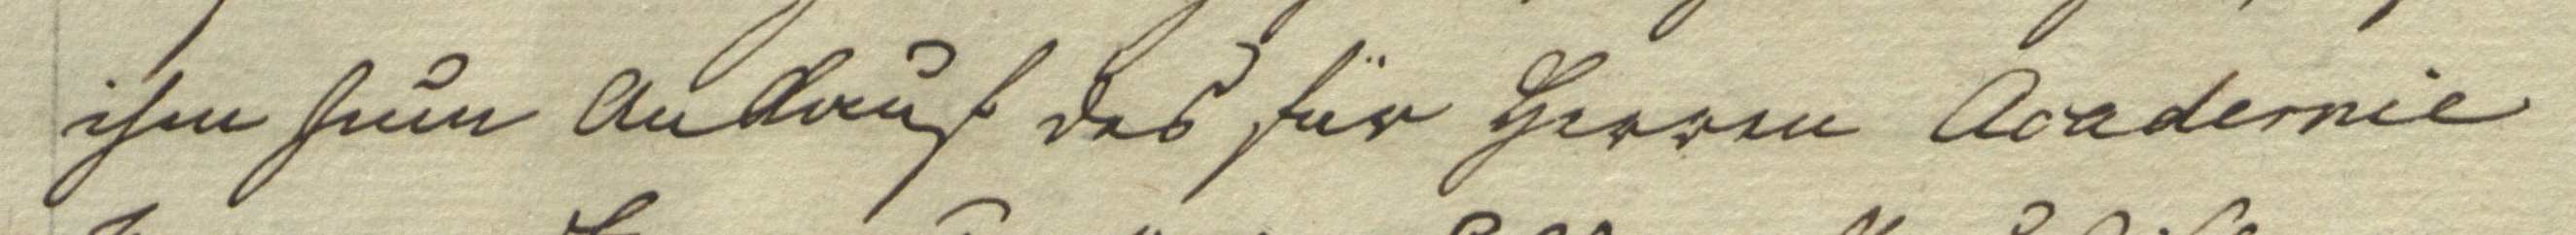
ihm zum Ankauf des für Herren Academie
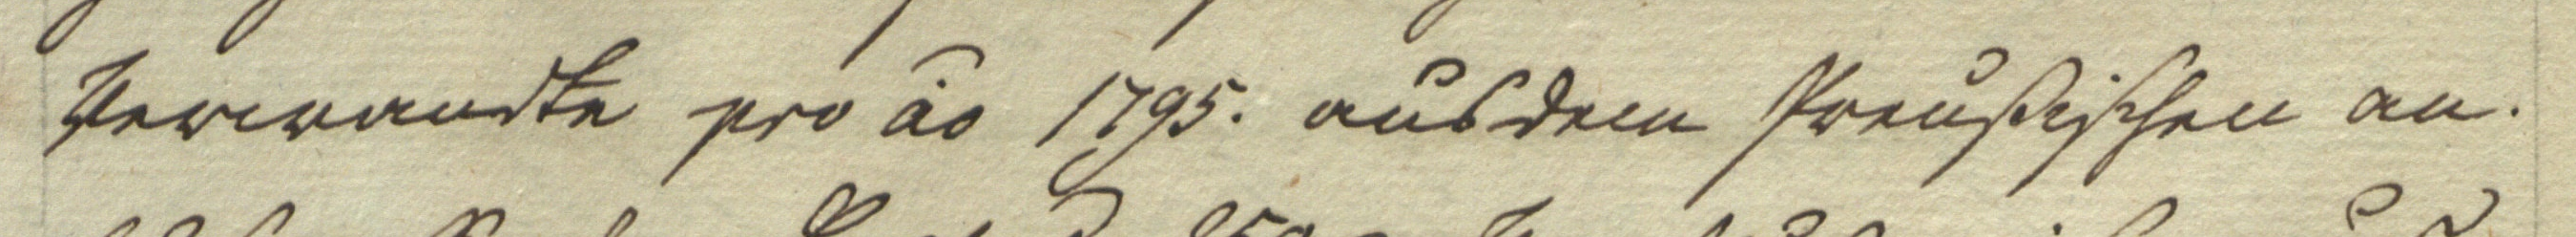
Verwandte pro ao 1795. aus dem Preußischen an¬
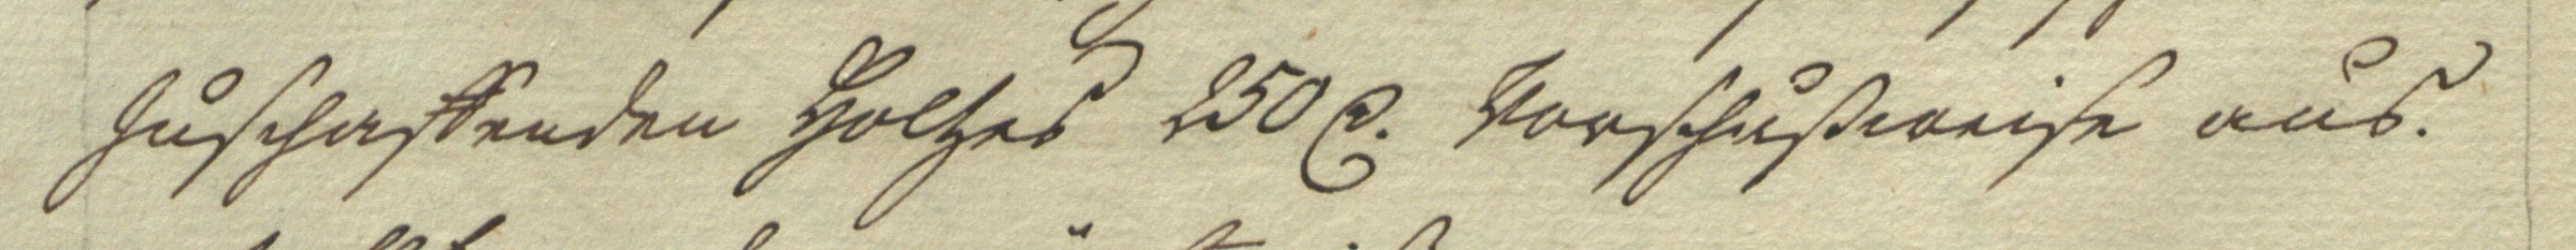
zuschaffenden Holzes 250 l. Vorschußweise aus¬
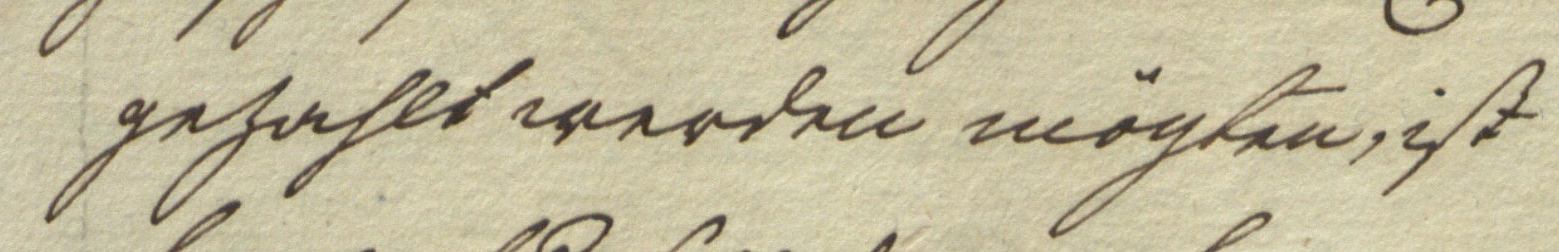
gezahlt werden mögten, ist
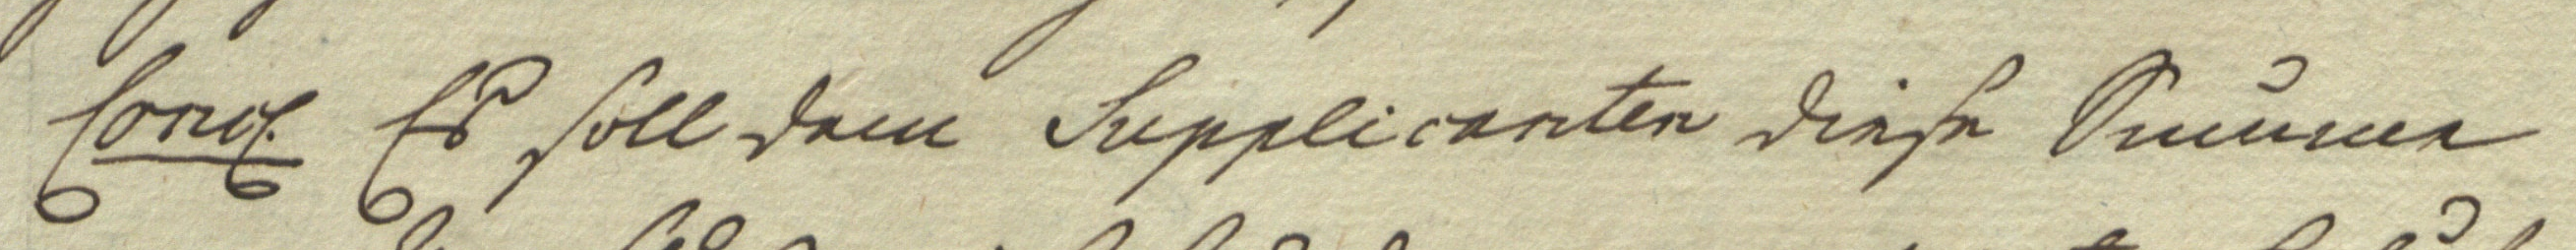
Concl. Es soll dem Supplicanten diese Summe
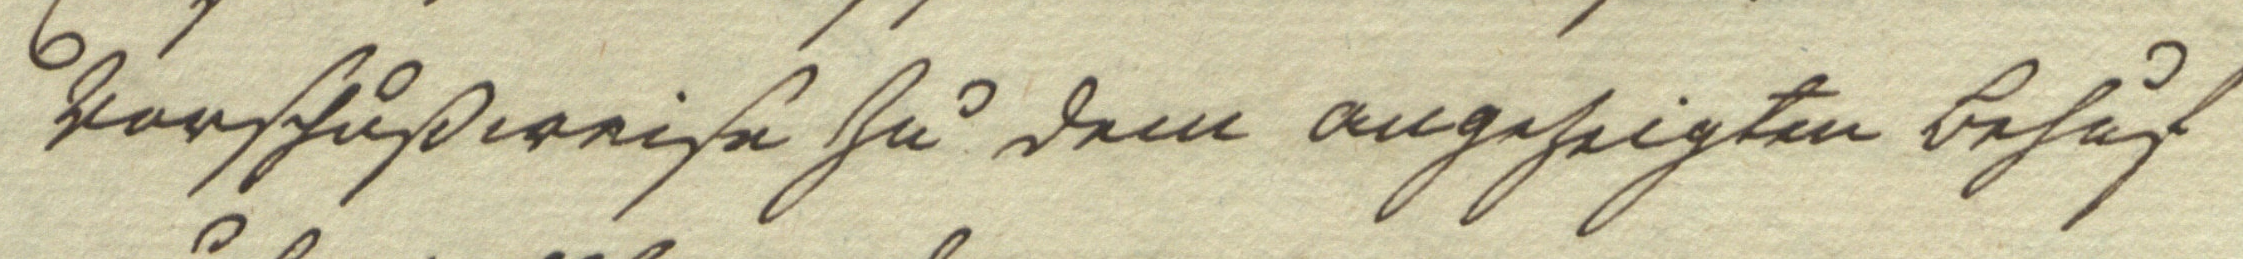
Vorschußweise zu dem angezeigten Behuf
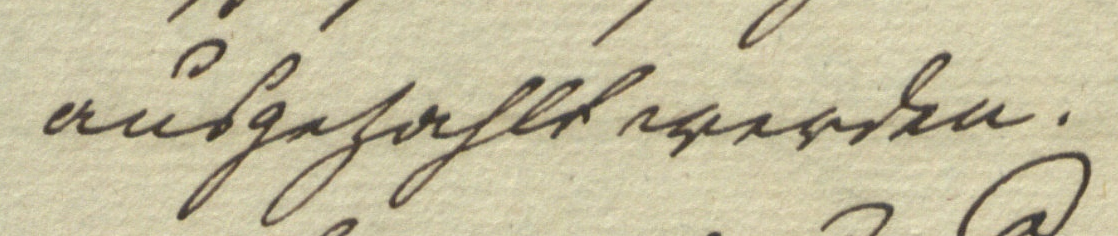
ausgezahlt werden.
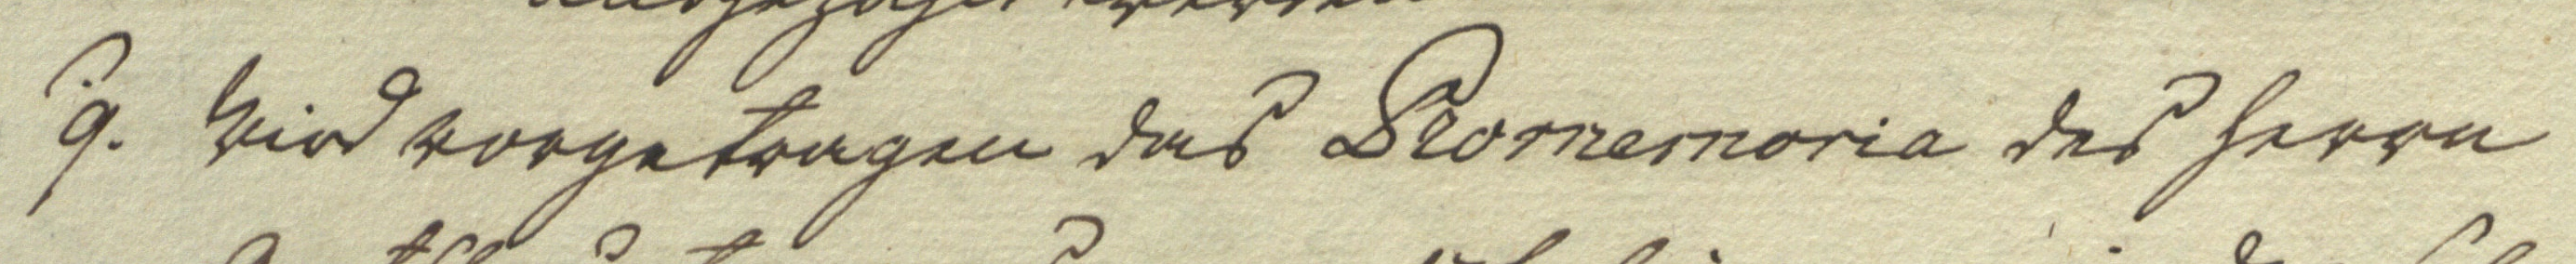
9. Wird vorgetragen das Promemoria des Herrn
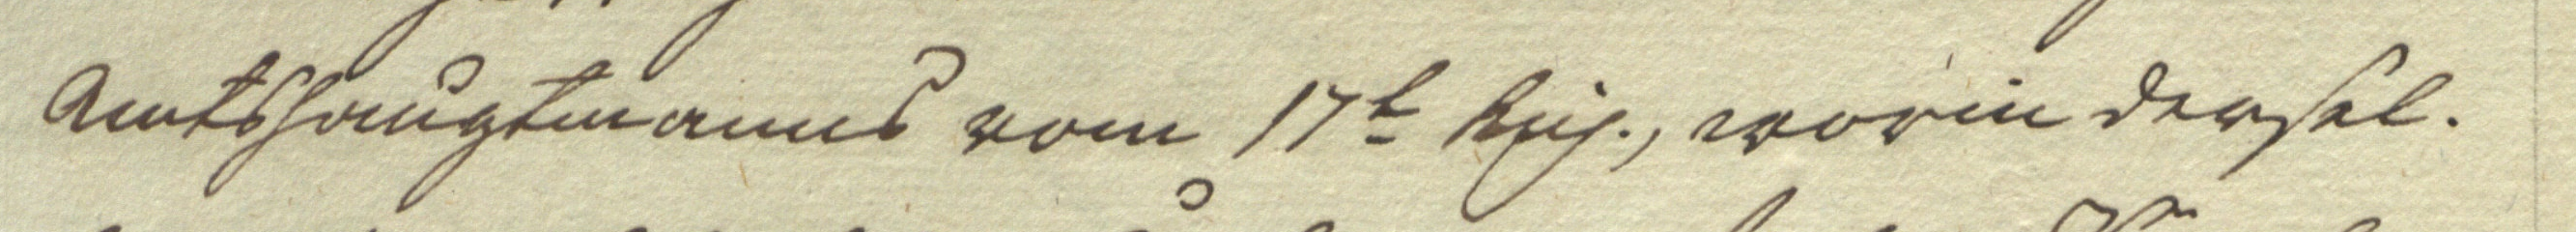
Amtshauptmanns vom 17 t huj., worin dersel¬
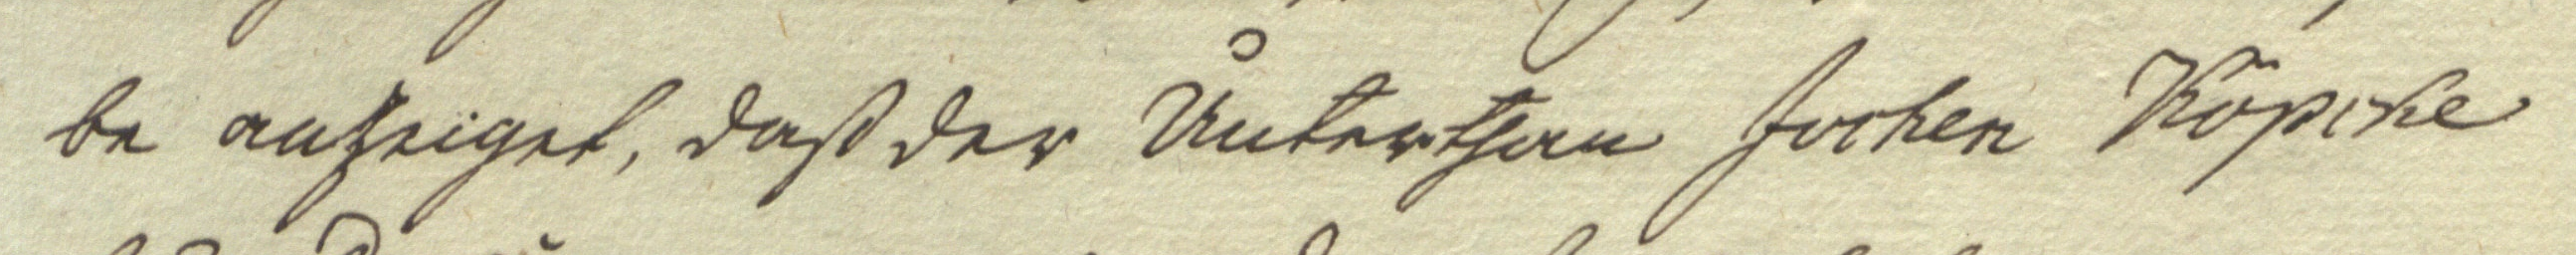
te anzeiget, daß der Unterthan Jochen Köpcke
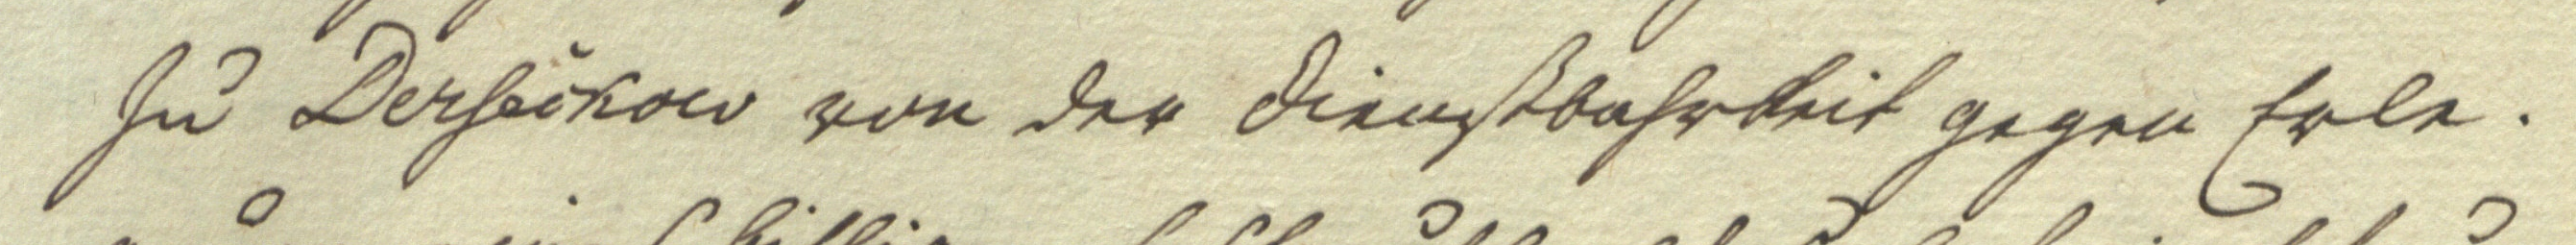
zu Derseckow von der Dienstbahrkeit gegen Erle¬
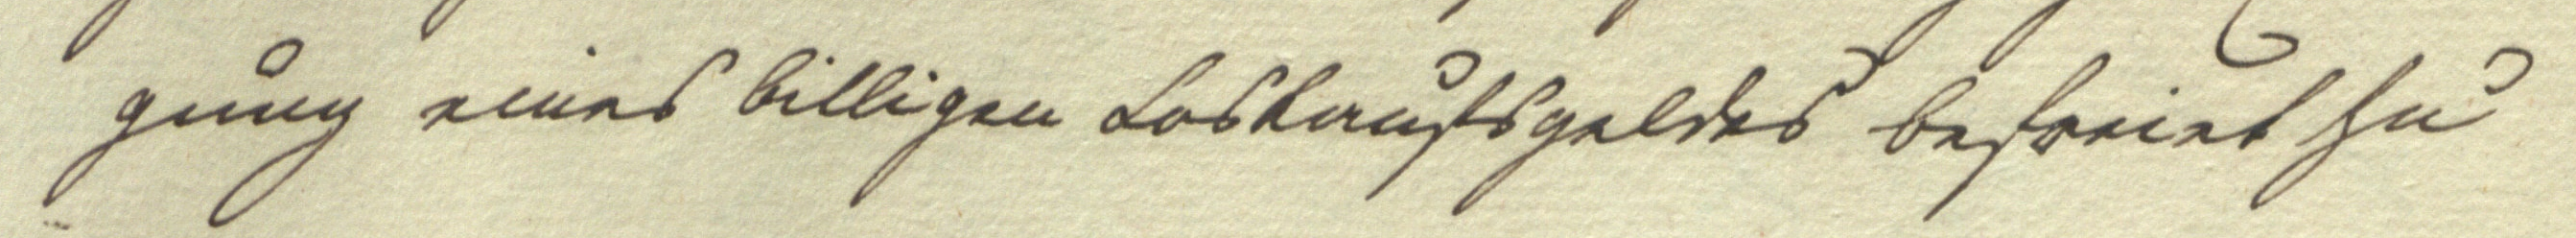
gung eines billigen Loskaufsgeldes befreiet zu
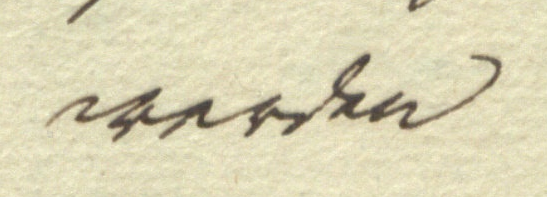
werden
